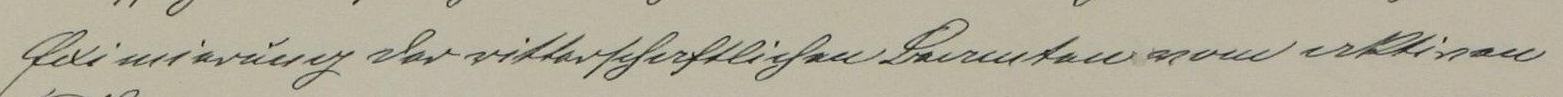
Eximierung der ritterschaftlichen Beamten vom aktiven
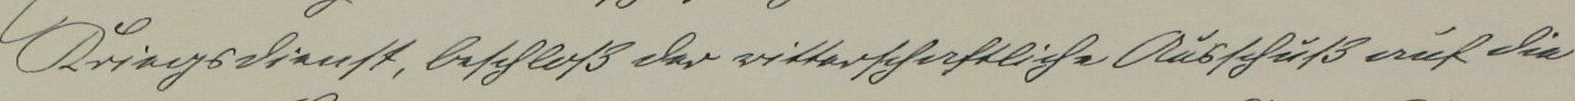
Kriegsdienst, beschloß der ritterschaftliche Ausschuß auf die
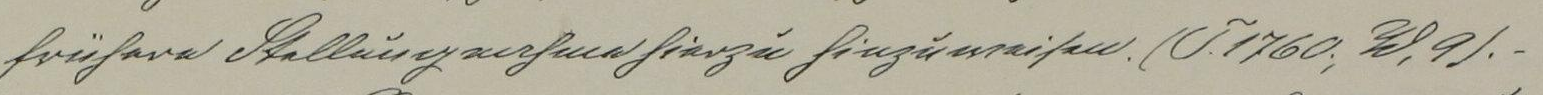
früheren Stellungnahmen hierzu hinzuweisen. (T.1760; W.9).
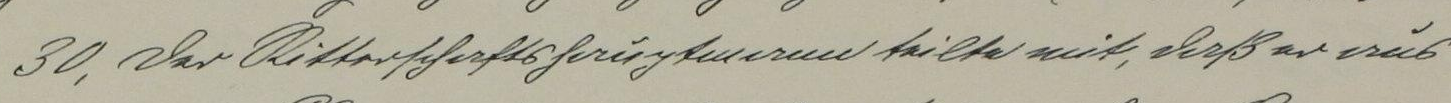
30. Der Ritterschaftshauptmann teilte mit, daß er aus
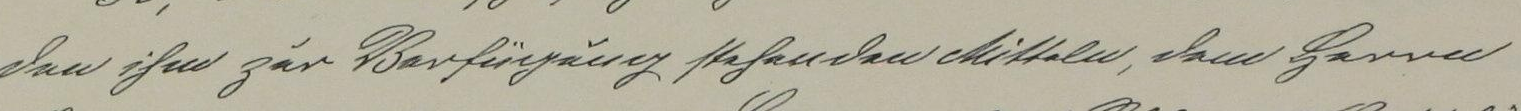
den ihm zur Verfügung stehenden Mitteln, dem Herrn
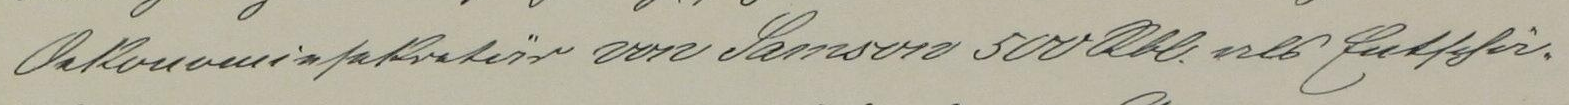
Oekonomiesekretär von Samson 500 Rbl. als Entschä-
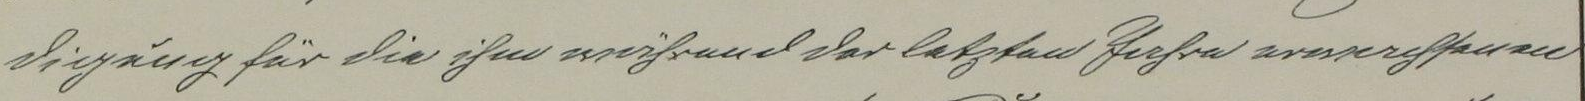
digung für die ihm während der letzten Jahre erwachsenen
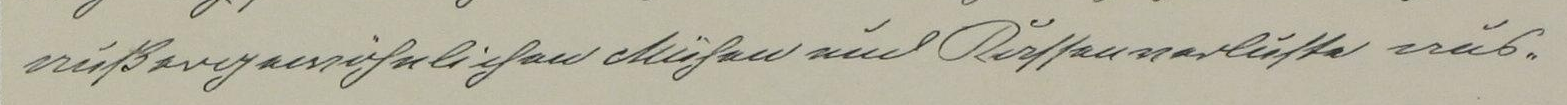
außergewöhnlichen Mühen und Kassenverluste aus-
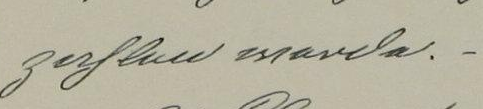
zahlen werde.
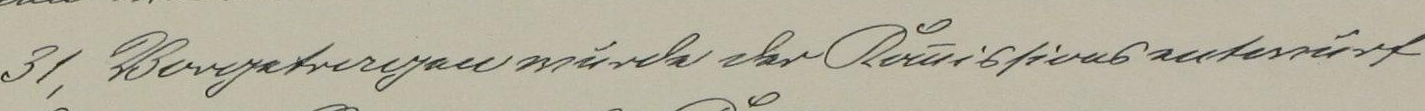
31. Vorgetragen wurde der Kommissionsentwurf
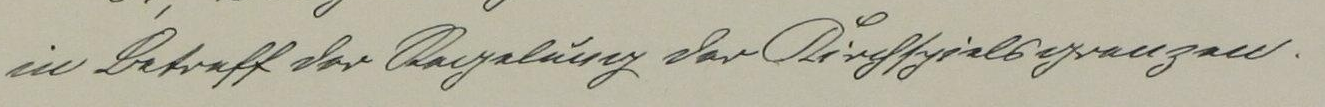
in Betreff der Regelung der Kirchspielsgrenzen.
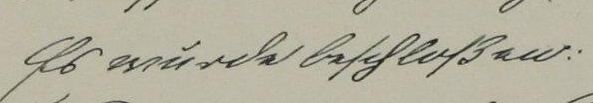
Es wurde beschloßen:
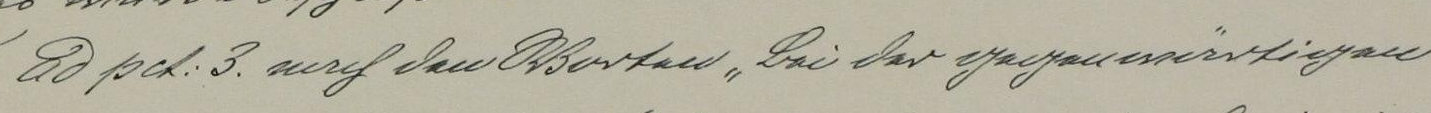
ad pct. 3. nach den Worten „Bei der gegenwärtigen
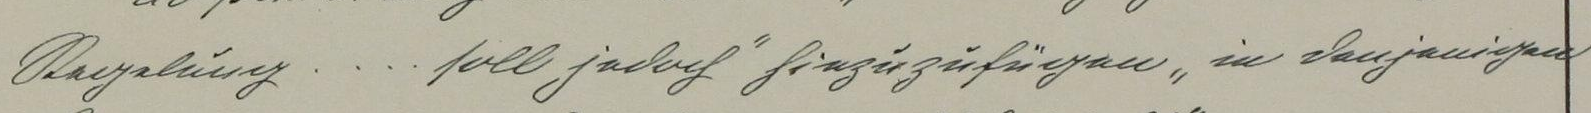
Regelung .... soll jedoch“ hinzuzufügen „in denjenigen
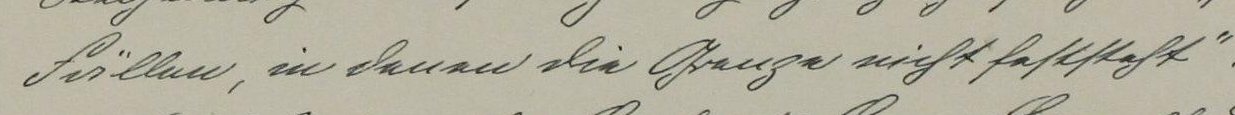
Fällen, in denen die Grenze nicht feststeht“.
